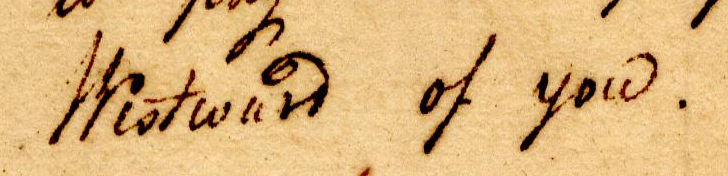Westward of you.
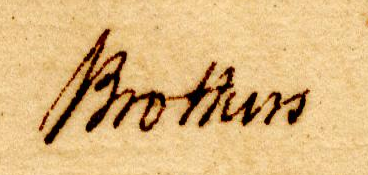Brothers
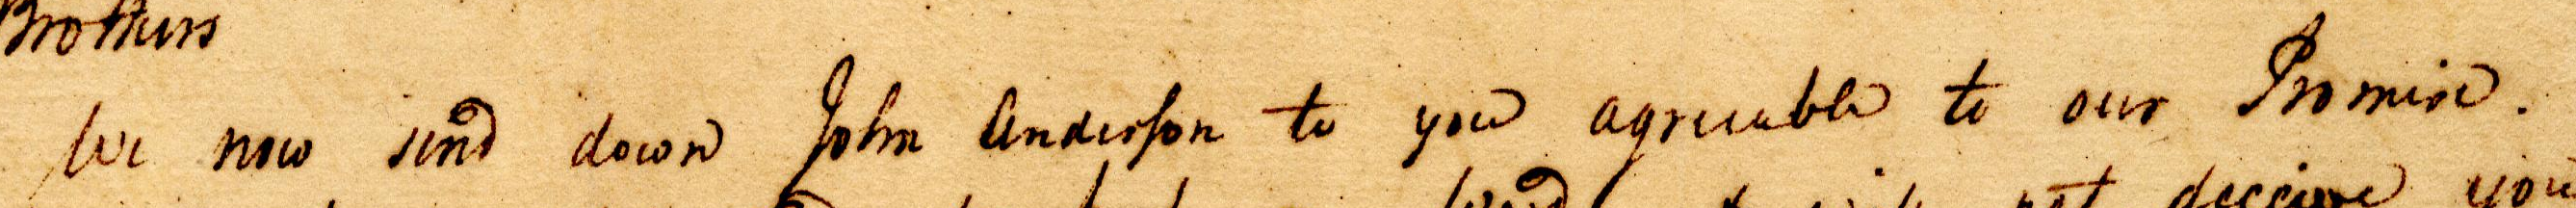We now send down John Anderson to you agreeable to our Promise.
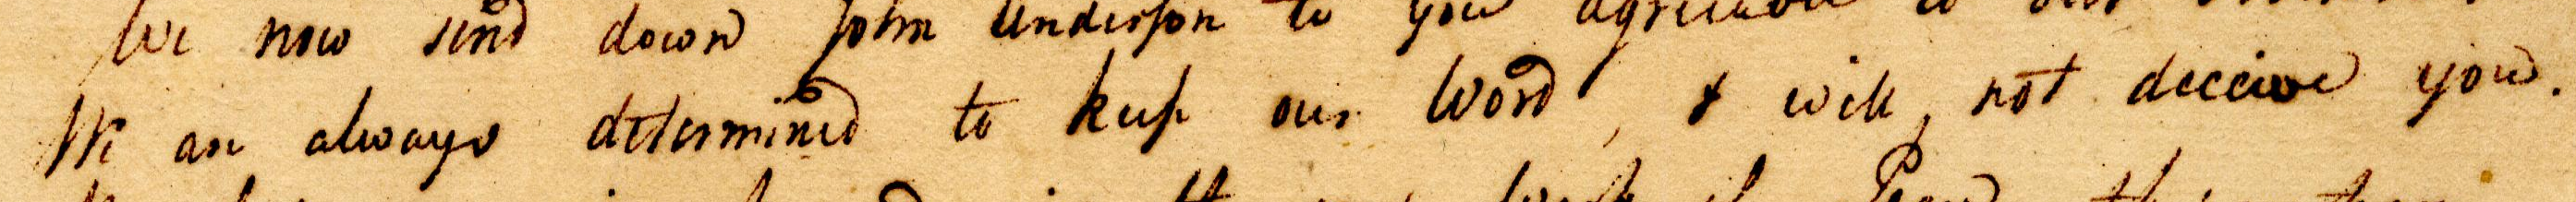We are always determined to keep our Word, & will not deceive you.
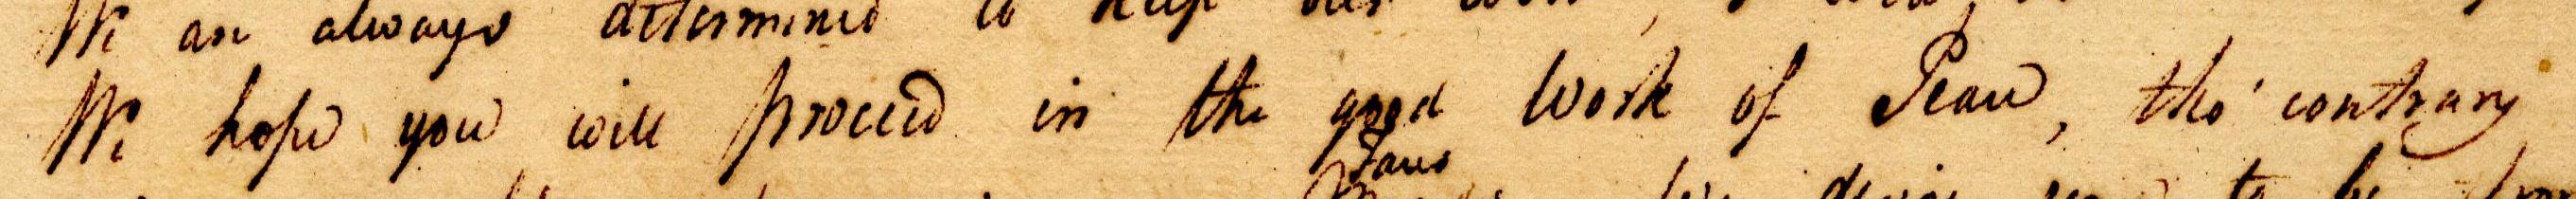We hope you will proceed in the good Work of Peace, tho' contrary
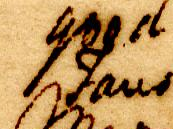Faces
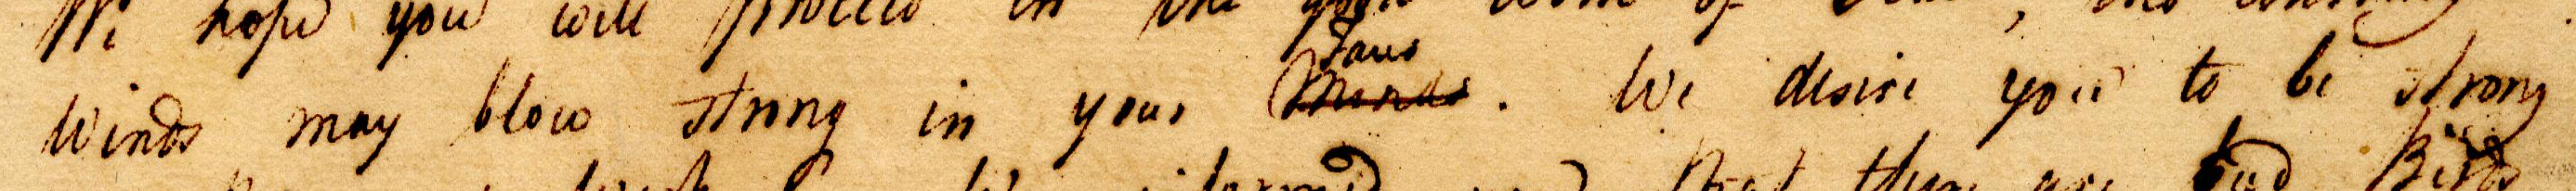winds may blow strong in your Minds ^. We desire you to be strong
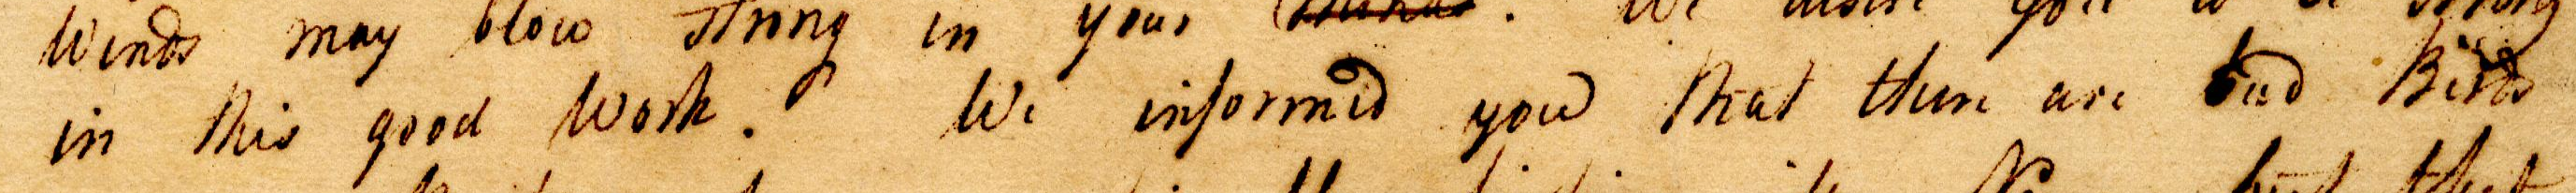in this good work. We informed you that then are bad Birds
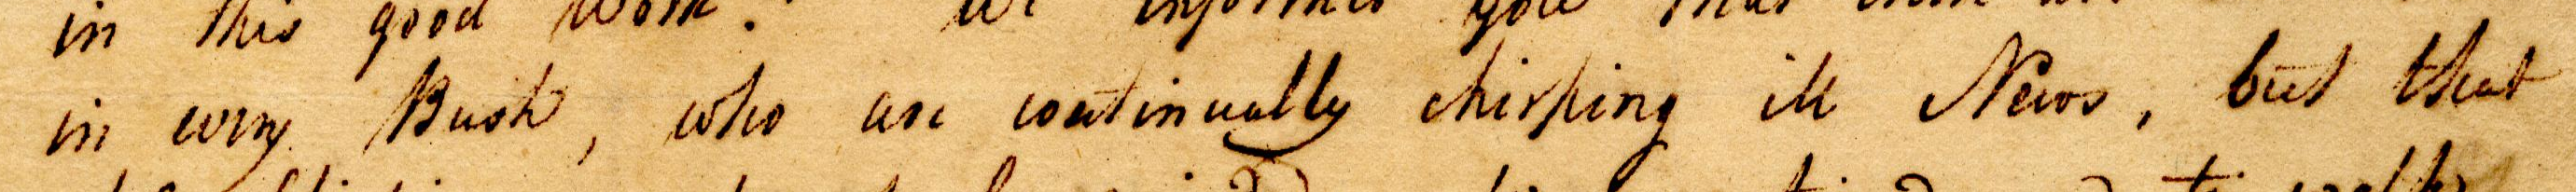in every Bush, who are continually chirping ill News, but that
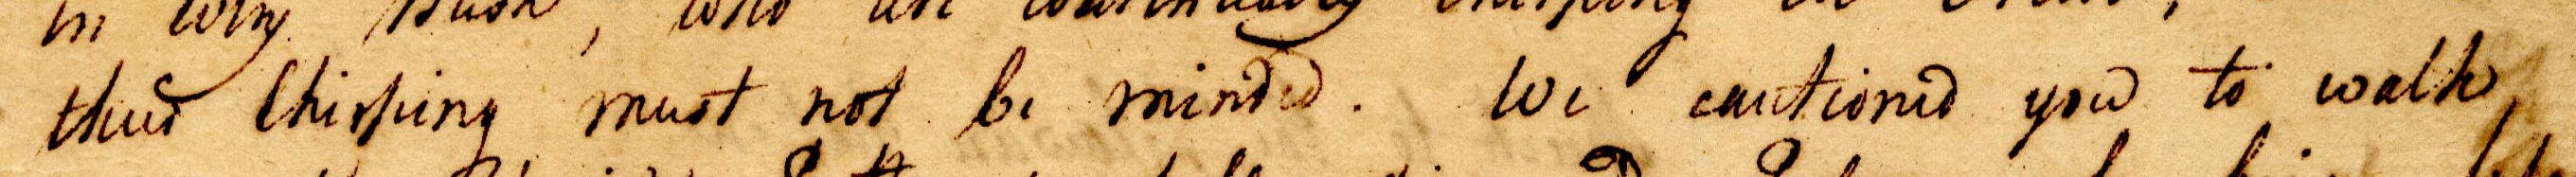this Chirping must not be minded. We cautioned you to walk
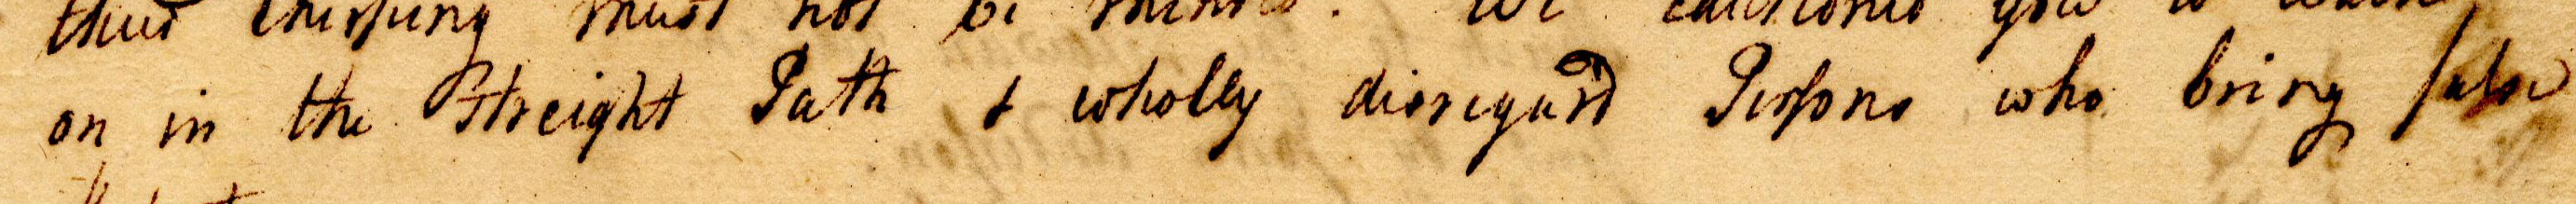on in the streight Path & wholly disregard Persons who bring false
